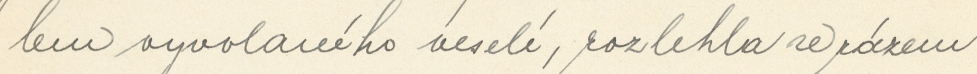lem vyvolaného veselí, rozlehla se rázem
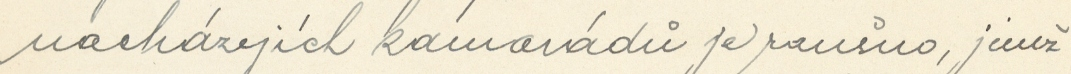nacházejích kamarádů je raněno, jimž
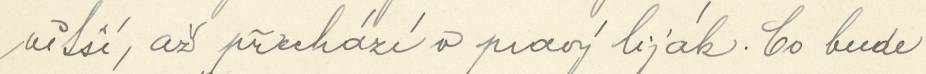větší, až přechází v pravý liják. Co bude
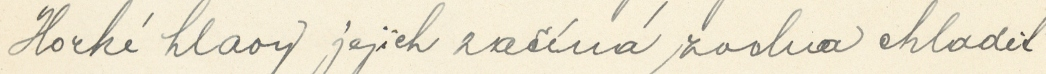Horké hlavy jejich začíná zvolna chladit
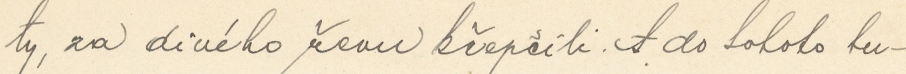ty, za divého řevu křepčili. A do tohoto bu-
